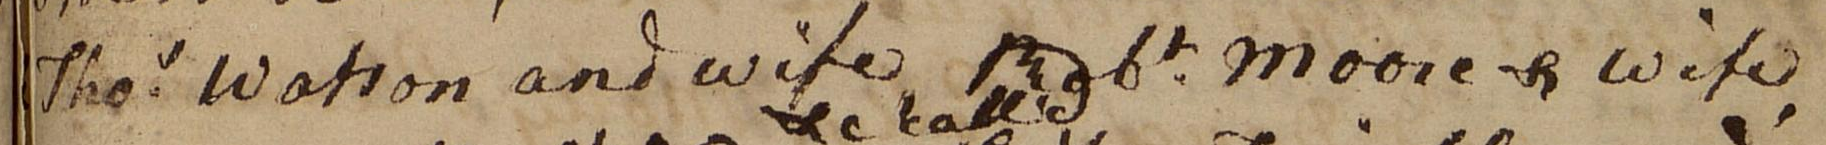Tho^s Watson and wife, Rob^t Moore & Wife,
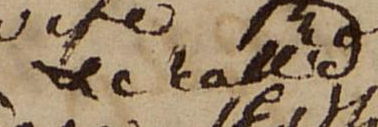&c call'd
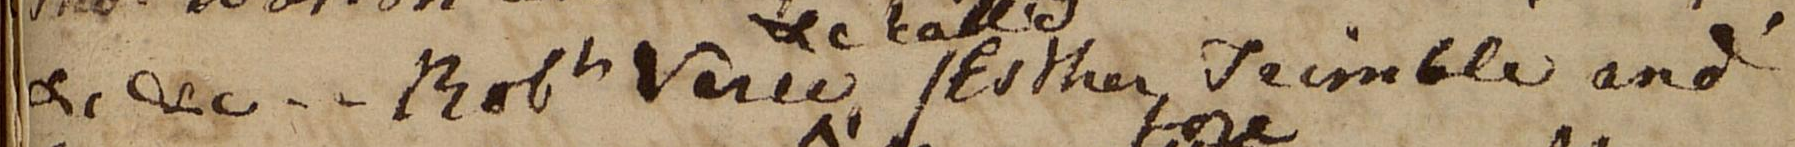&c &c-- Rob^t Veree. /Esther Trimble and
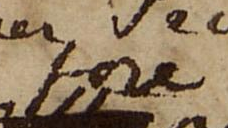fore
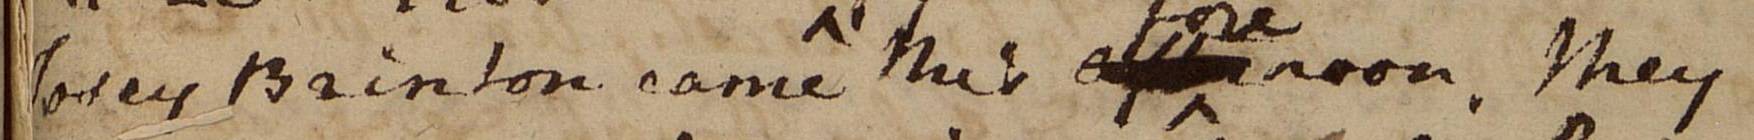Josey Brinton came this afternoon, they
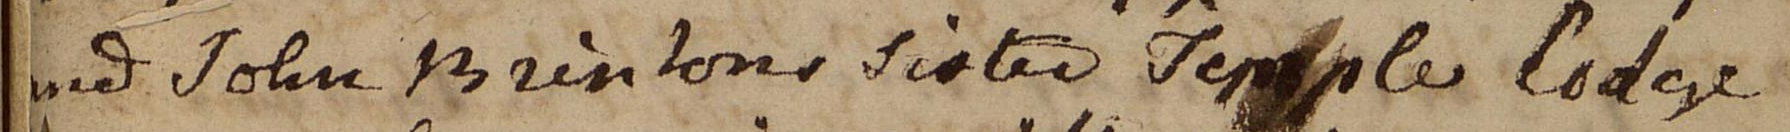and John Brintons sister [Temple] lodge
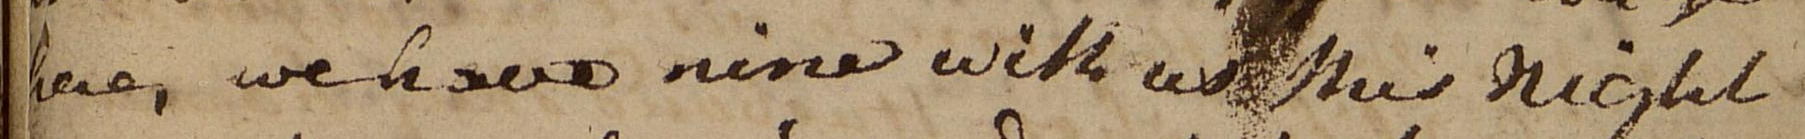here, we have nine with us this Night
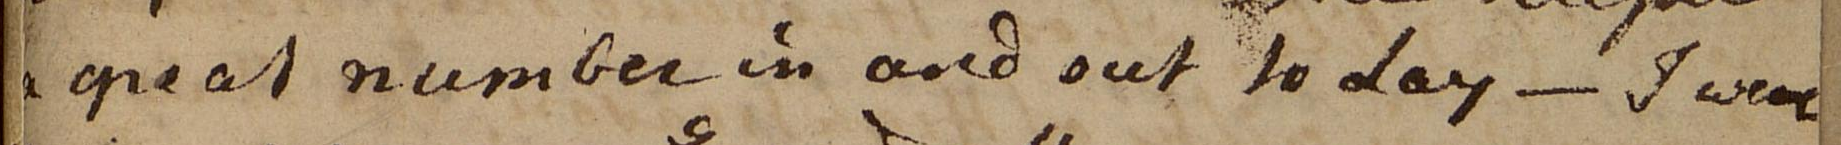a great number in and out to day- I wen
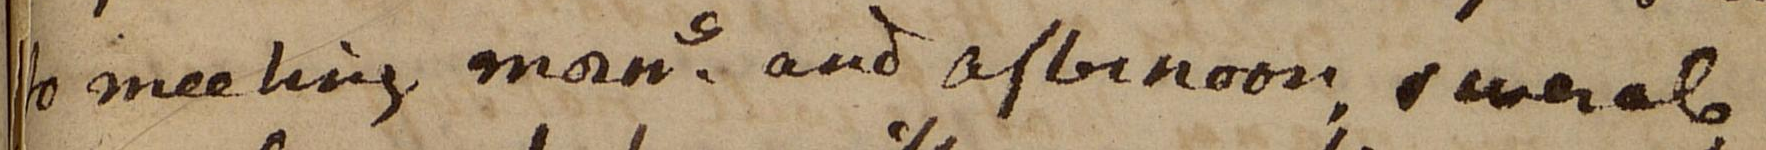to meeting morn.^g and afternoon, several
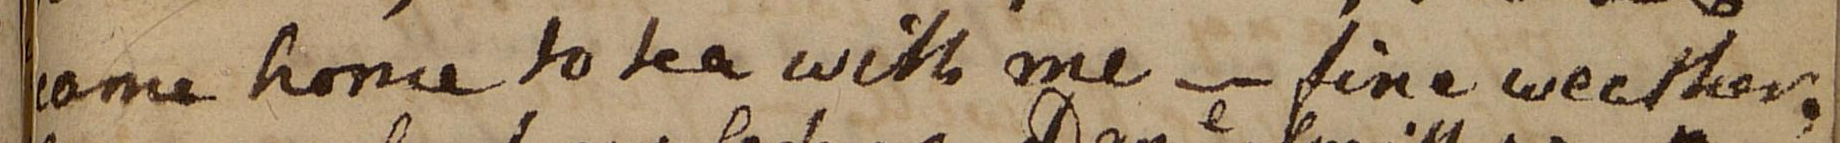came home to tea with me- fine weather.
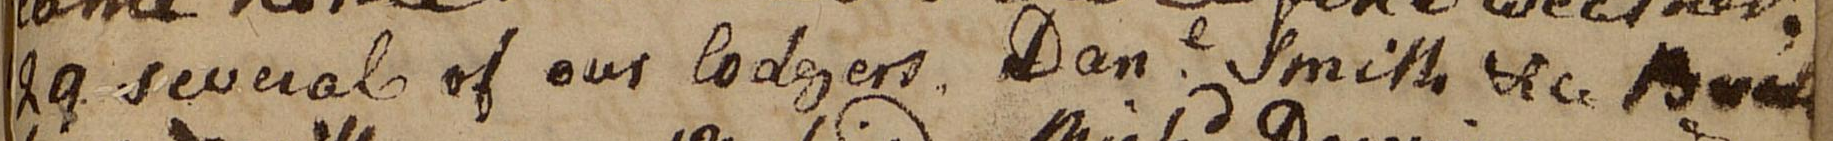29 several of our lodgers, Dan^l. Smith &c B[ua]
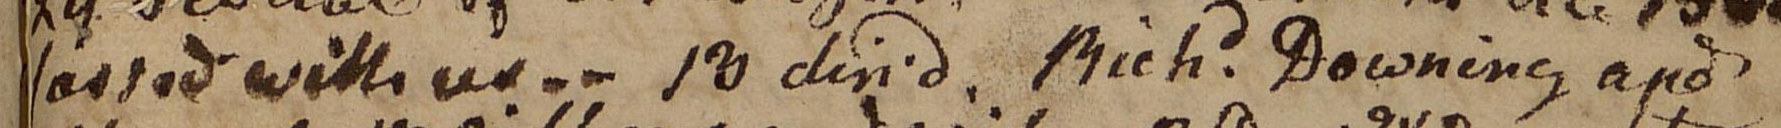lassod with us.- 13 din'd, Rich^d Downing and
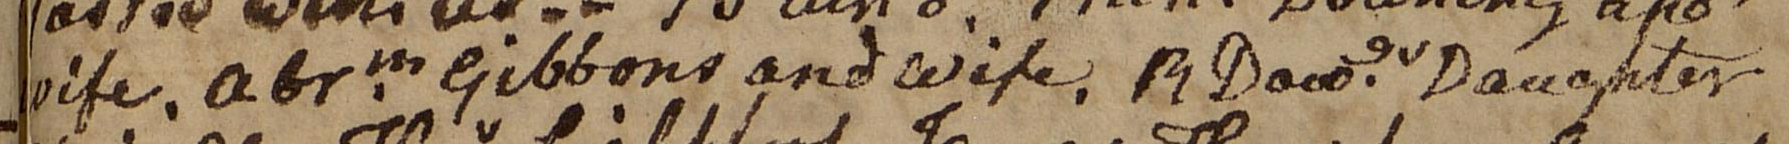wife, Abr^m. Gibbons and wife, R Dow^gs Daughter
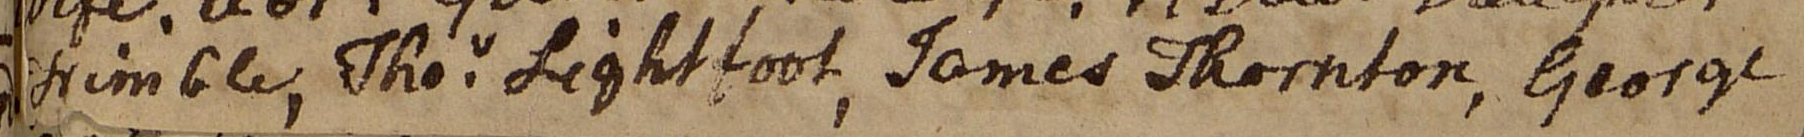Trimble, Tho.^s Lightfoot, James Thornton, George
